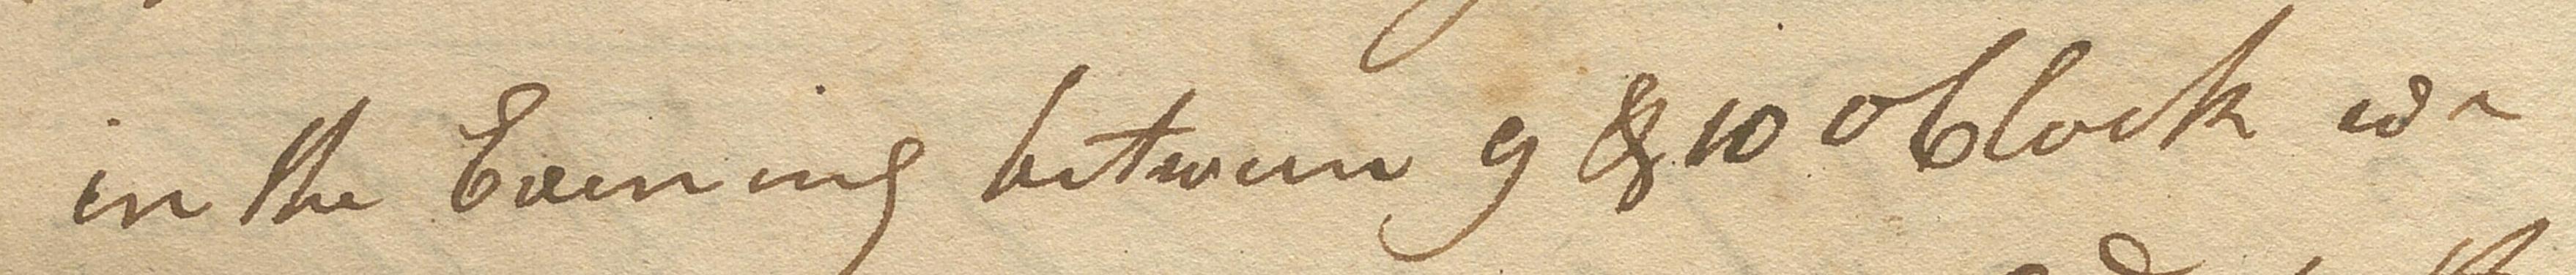in the Evening betwen 9 & 10 oClock we
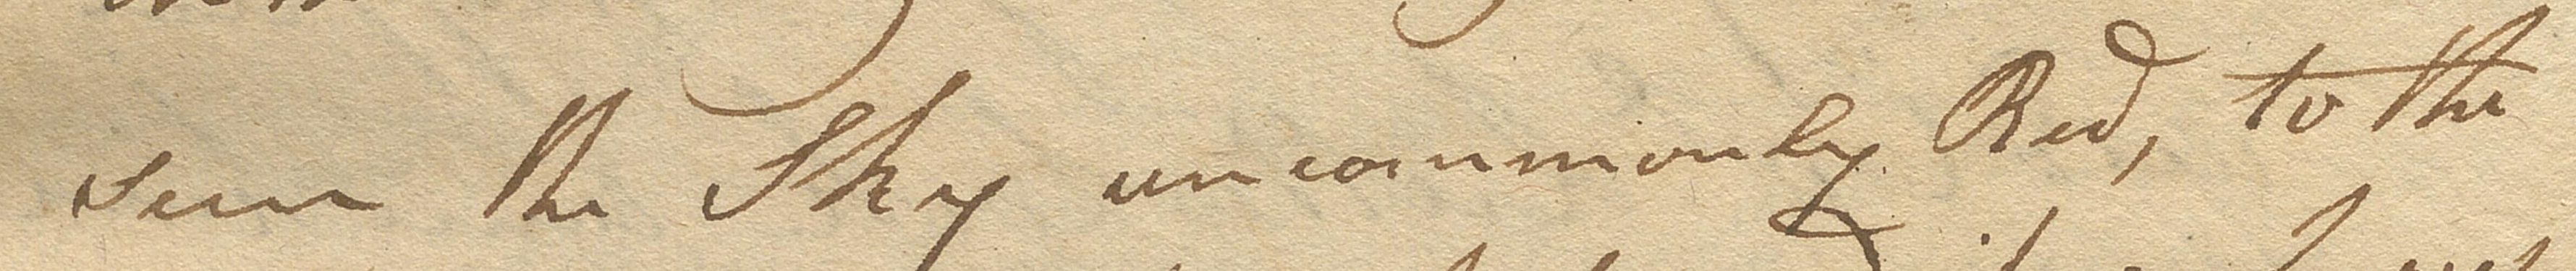seen the Sky uncommonly Red, to the
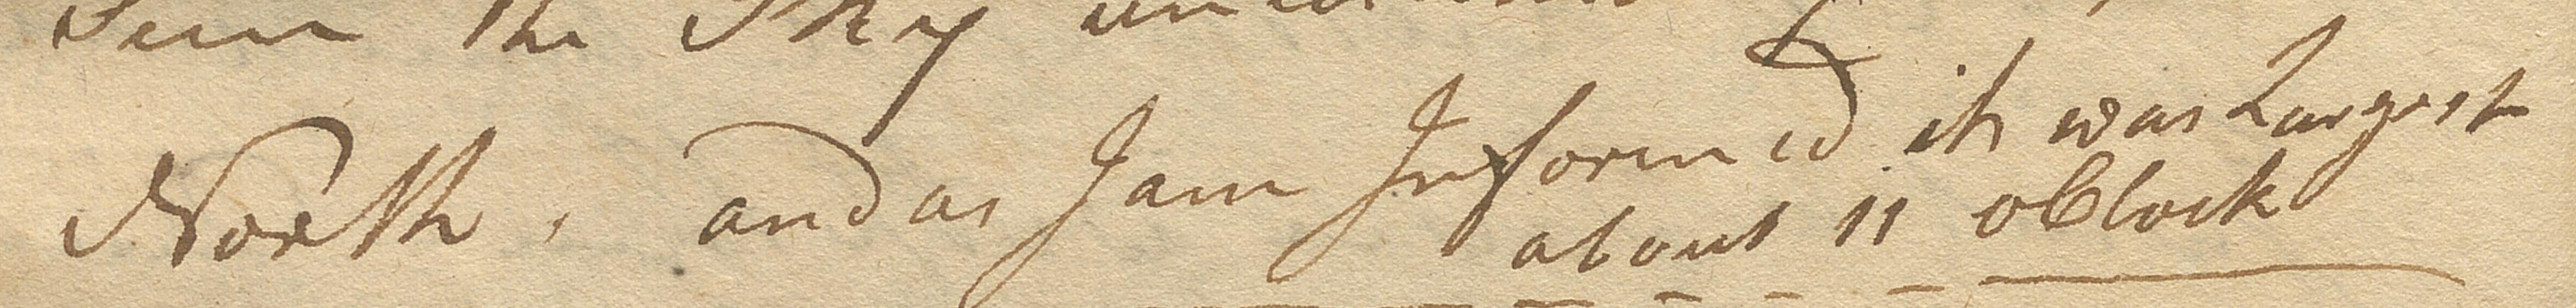North, and as I am Informed it was Largest
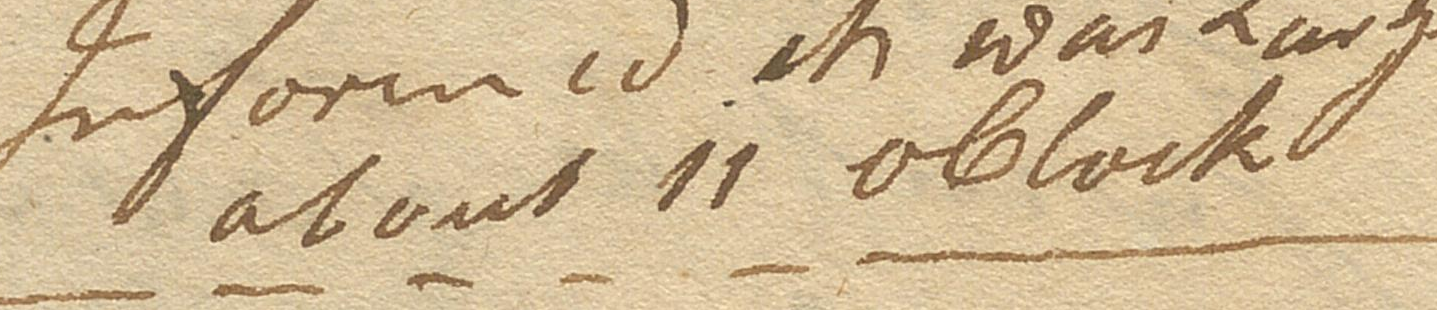about 11 oClock
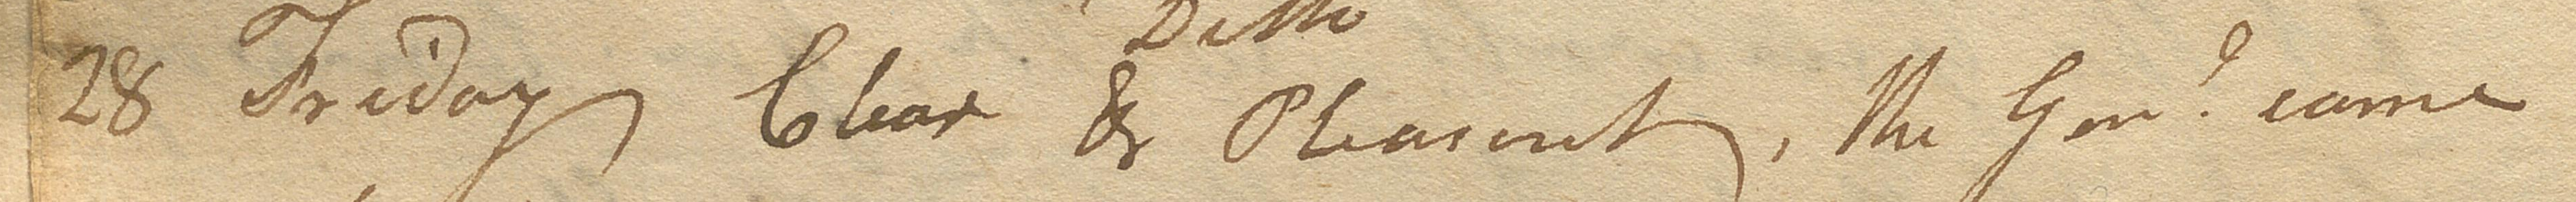28 Friday Clear & Pleasent, the Gen^l. came
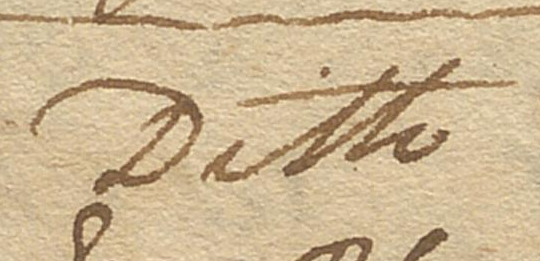Ditto
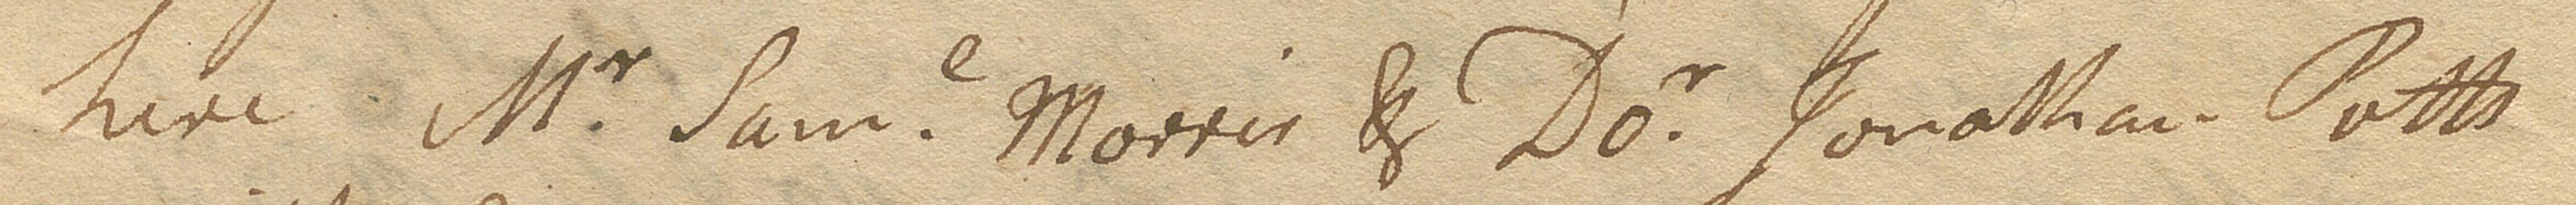here M^r. Sam^l. Morres & Do^r. Jonathan Potts
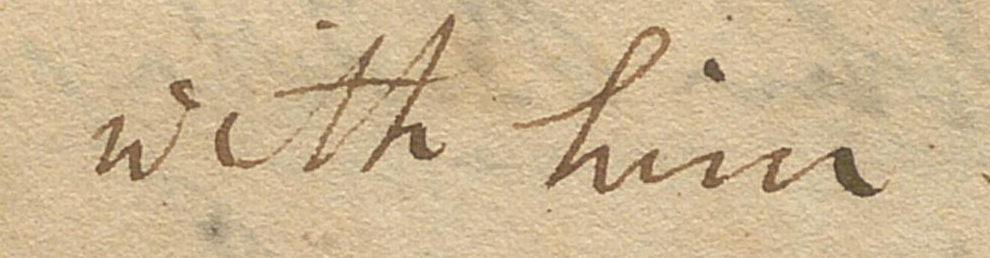with him
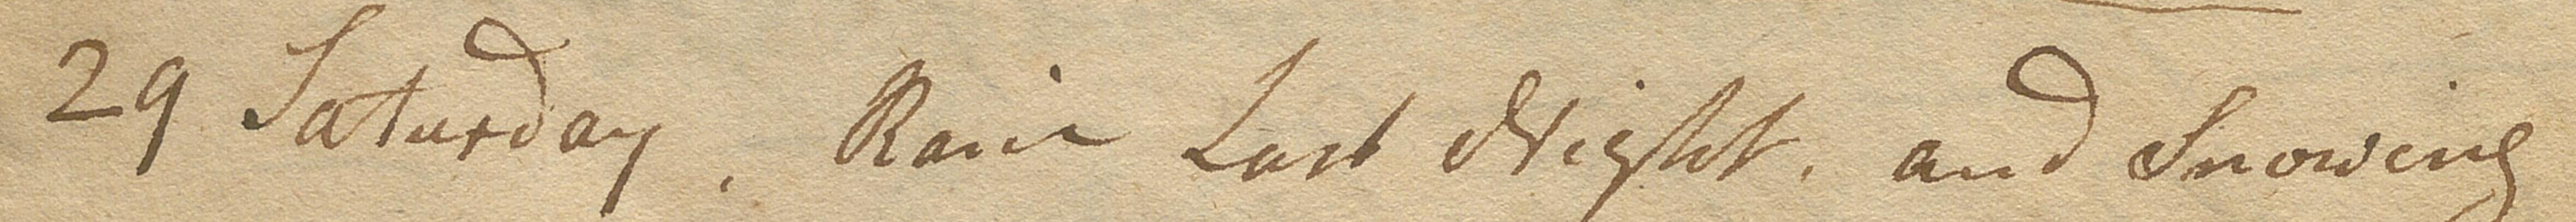29 Saturday Rain Last Night, and snowing
